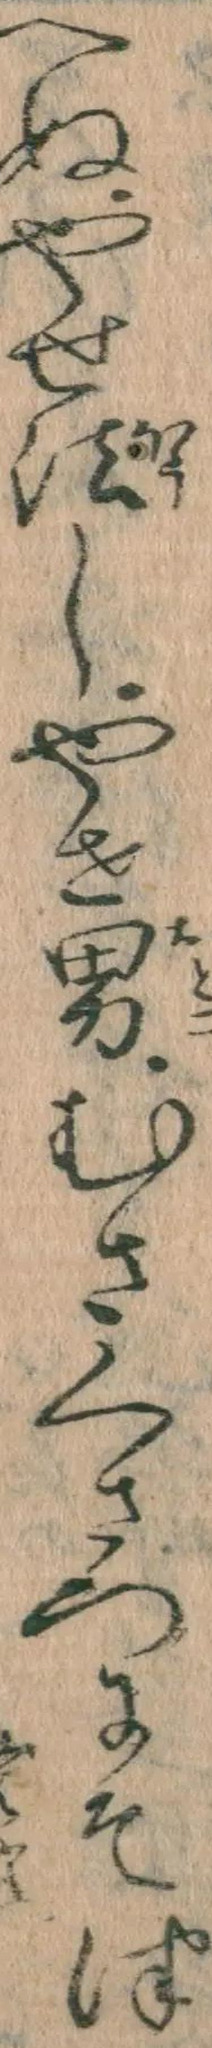へぬ、やせ法し、やせ男、むさくさつにそつ
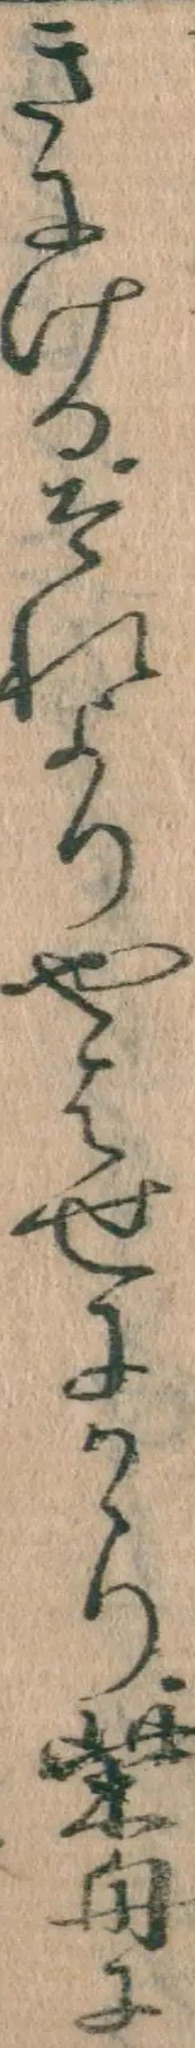きにける、それよりやはせにかゝり、柴舟に
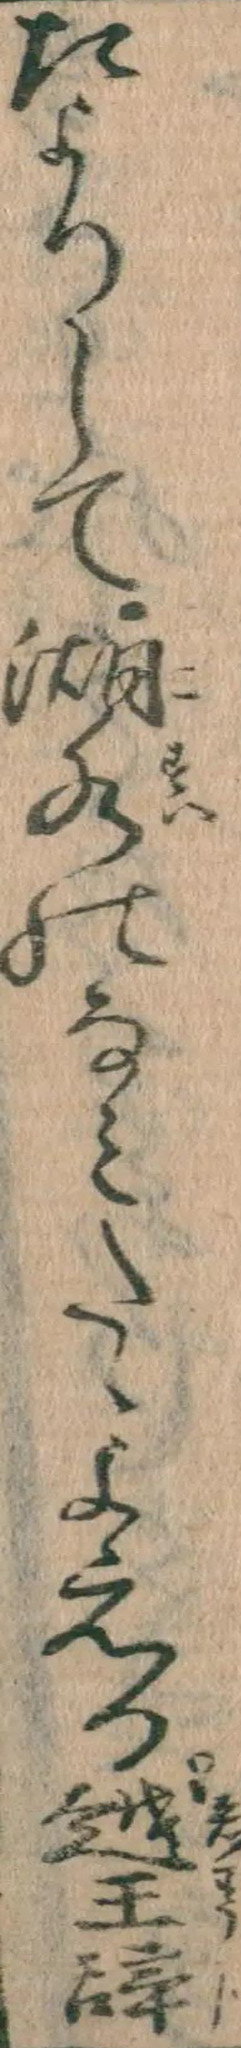たよりして、湖水のなみたゝよえる。越王辞
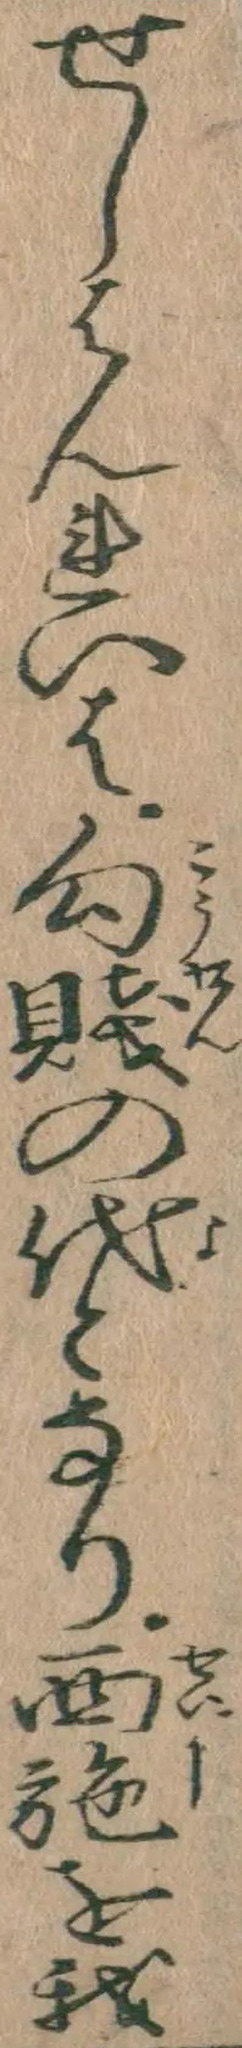せしはんれいは、勾践の代となり、西施を我
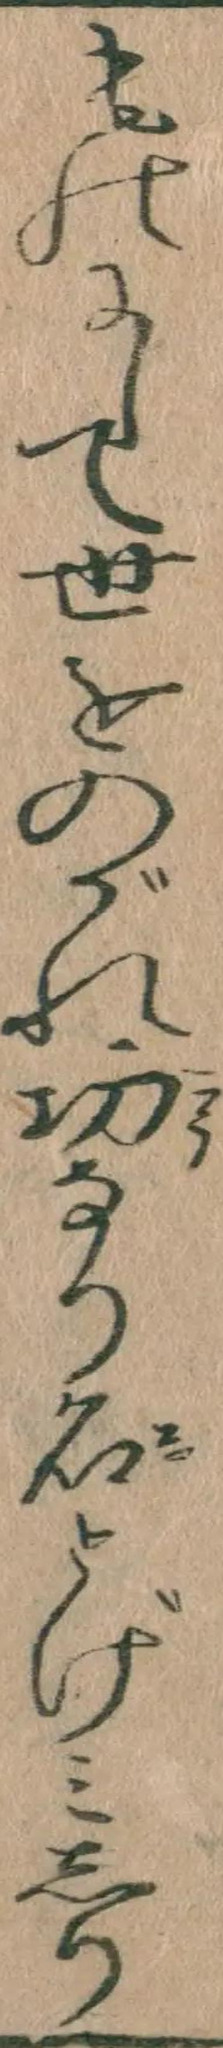ものとして世をのがれ、功なり名とげみしり
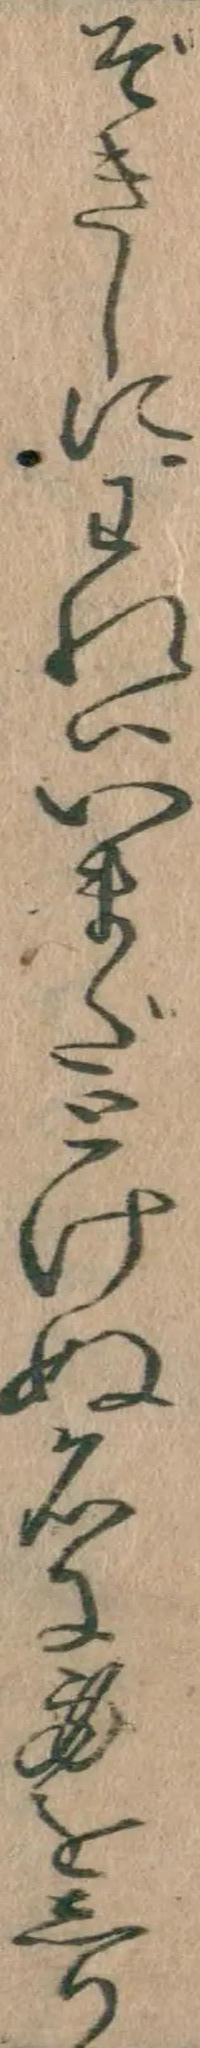ぞきしに、われはいまだとけぬ名に身をしり
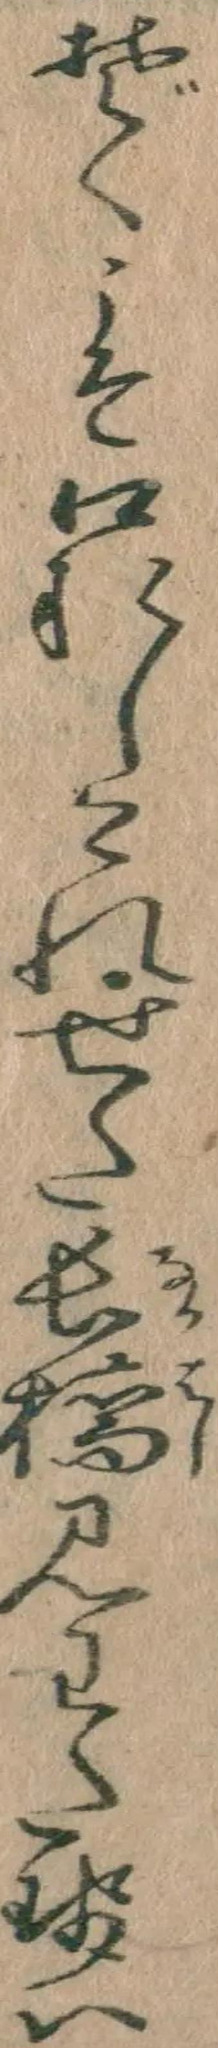ぞくこそ口おしけれ、せた長橋見わたせは
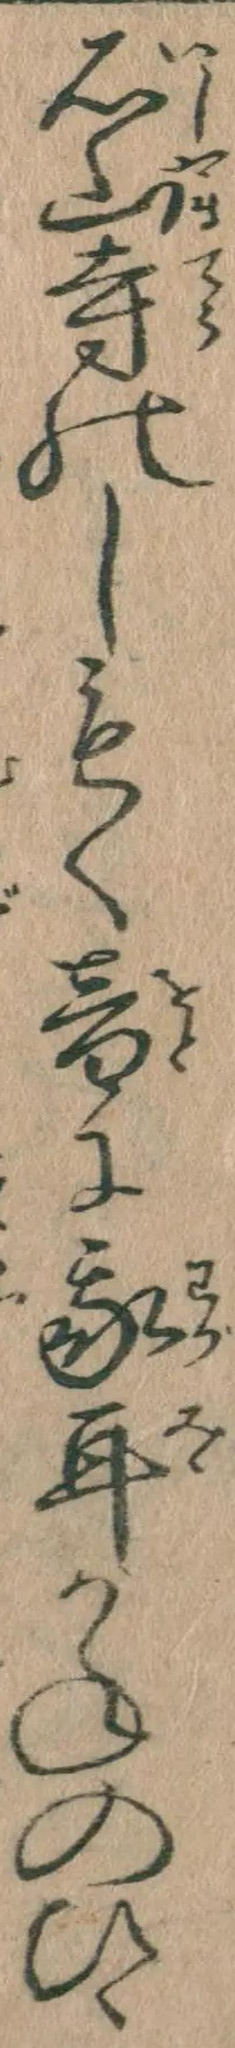石山寺のしもく音に我耳かねのひゝ
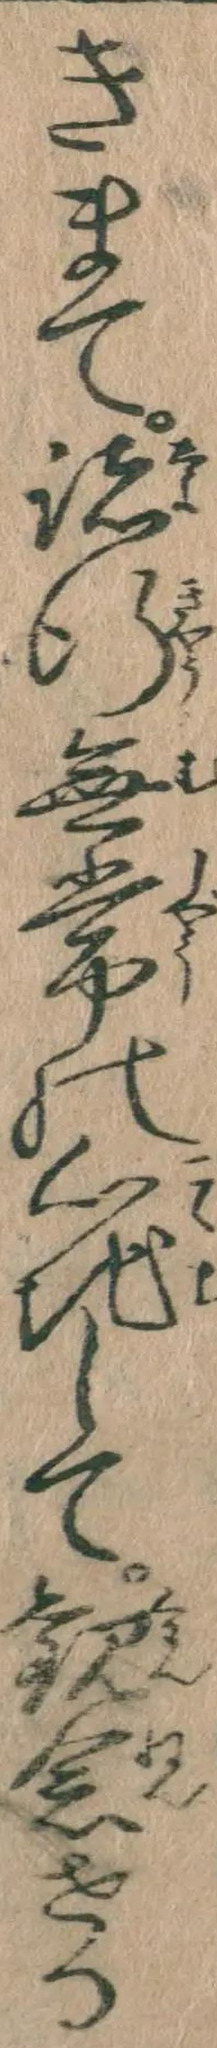きまて。諸行無常の心地して。観念せる
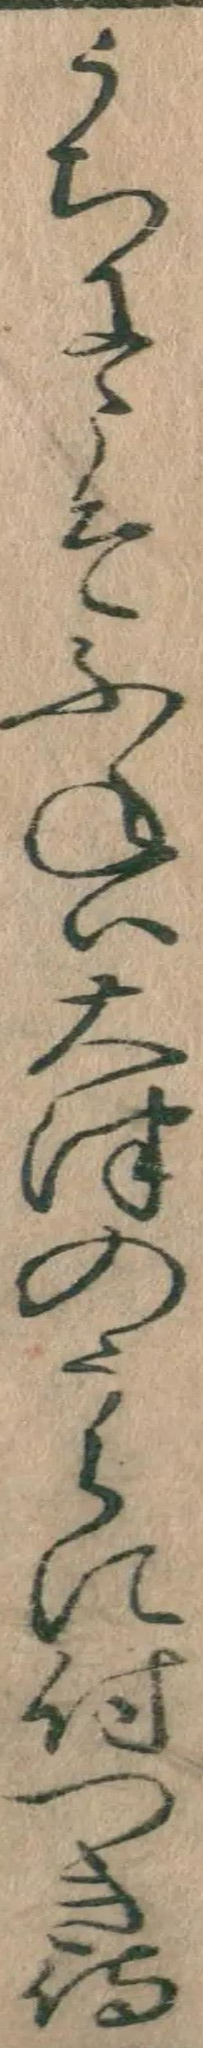うちにこそふねは大津のうらに付つき侍
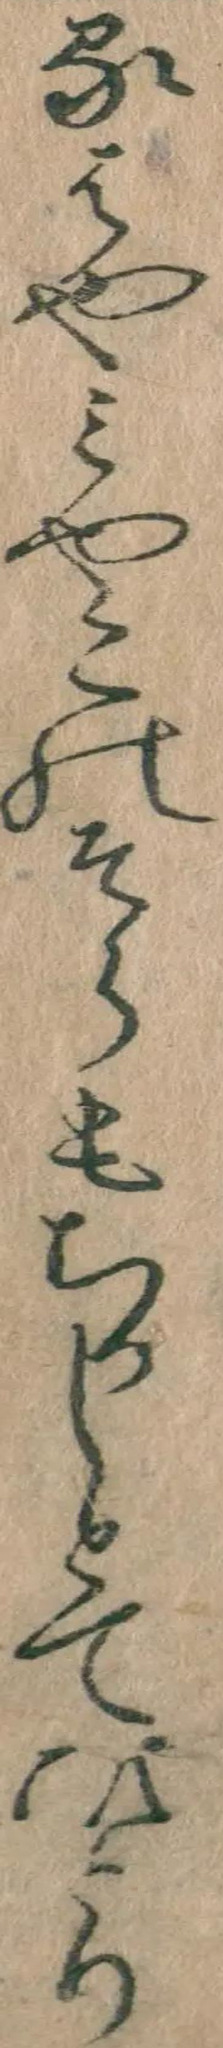るはやみやこのそらもちかしとて、ひとり
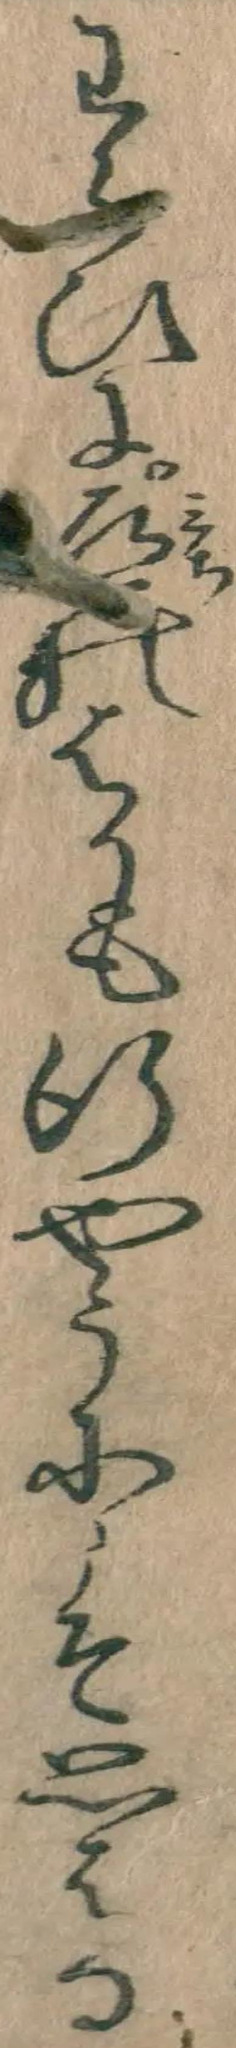わらひに。道のはかも行やうにこそ思はる
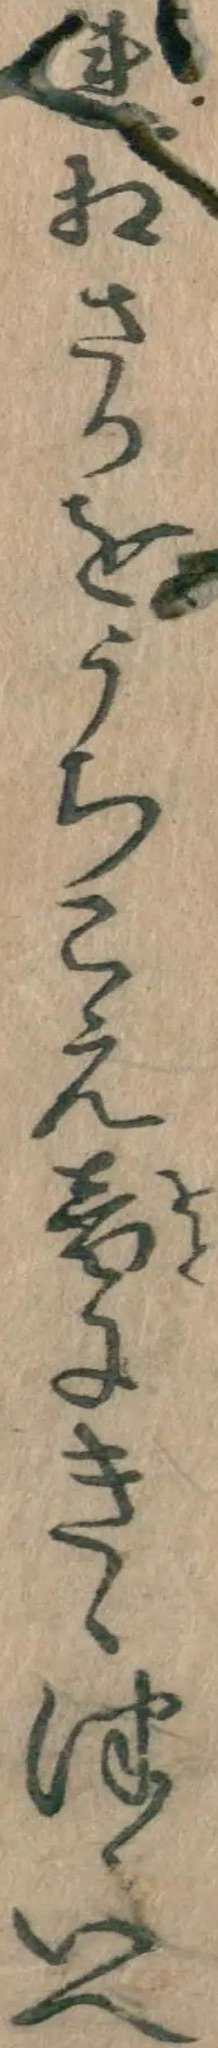れ相さかをうちこえ音にきゝつゝいへ

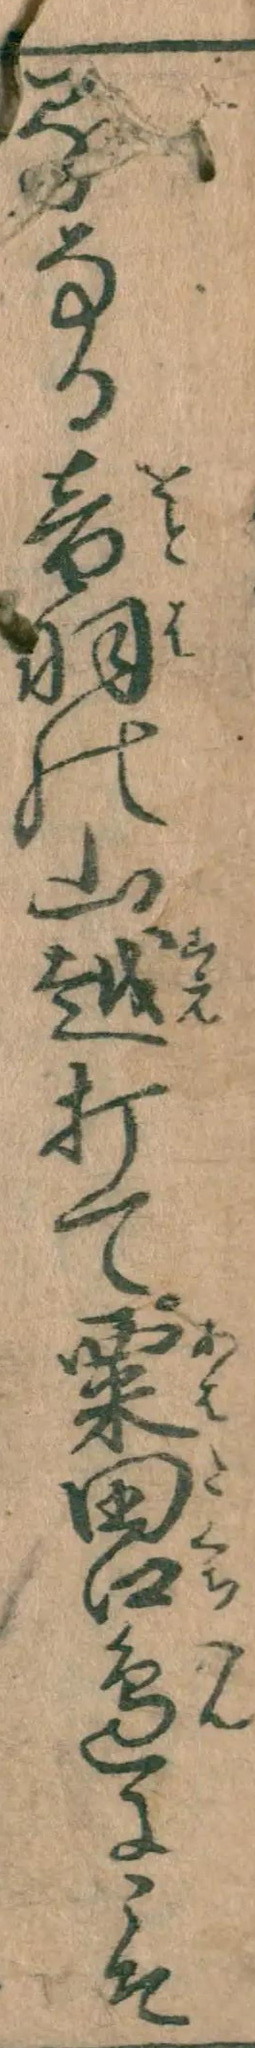るなる音羽の山越打て。粟田口辺にこそ
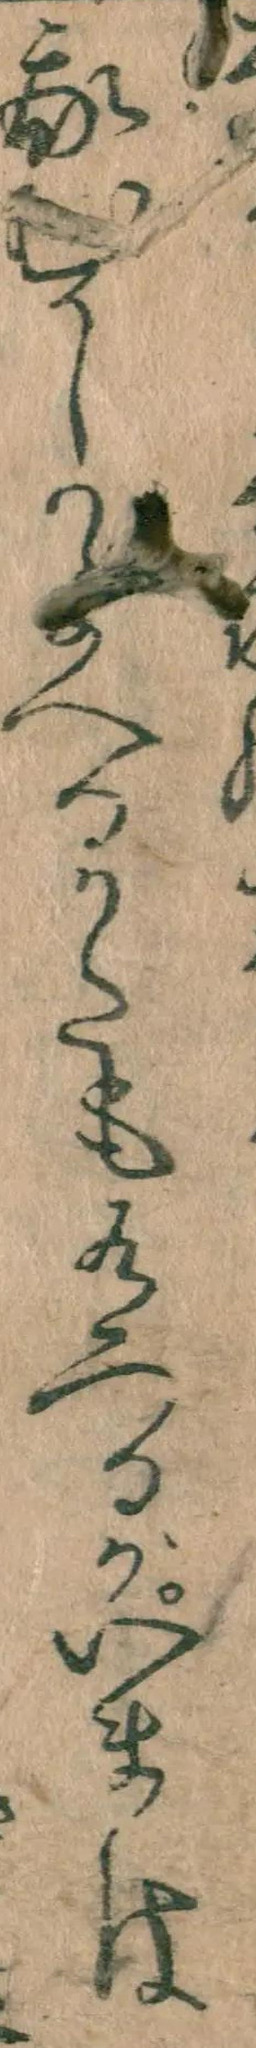我むかしかよへるかたも有つるか。いまは
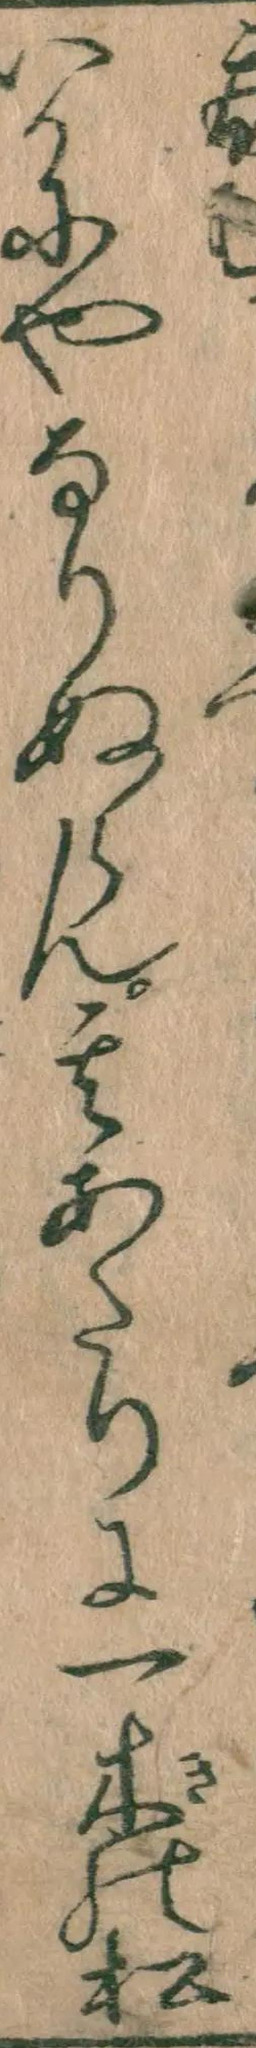いかにやなりぬらん。其あたりに一木の松
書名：竹斎狂歌物語 3巻
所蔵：国立国会図書館 National Diet Library, JAPAN
